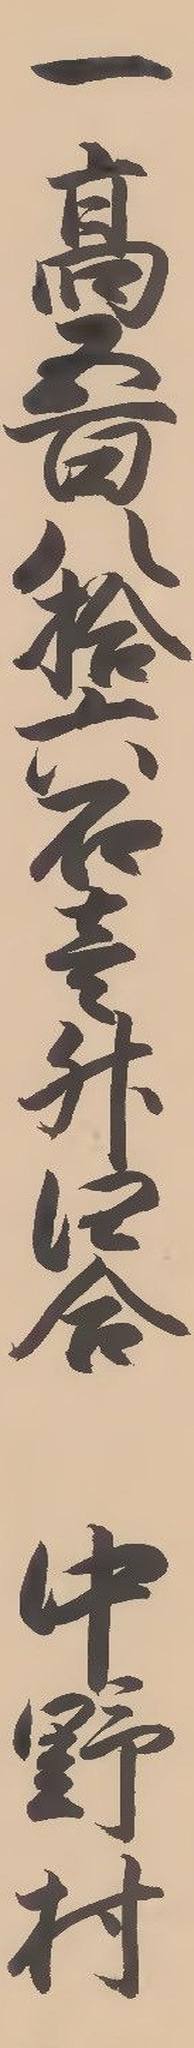一高五百八拾六石壱升四合中野村
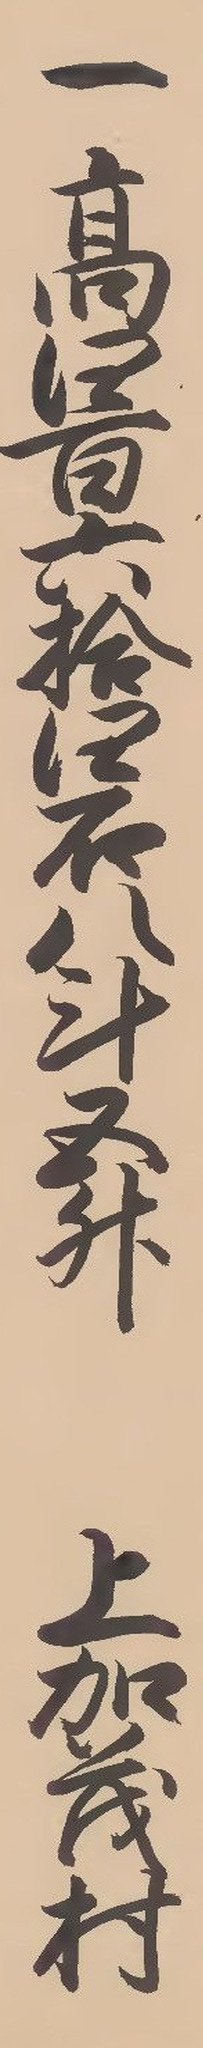一高四百六拾四石八斗五升上加茂村
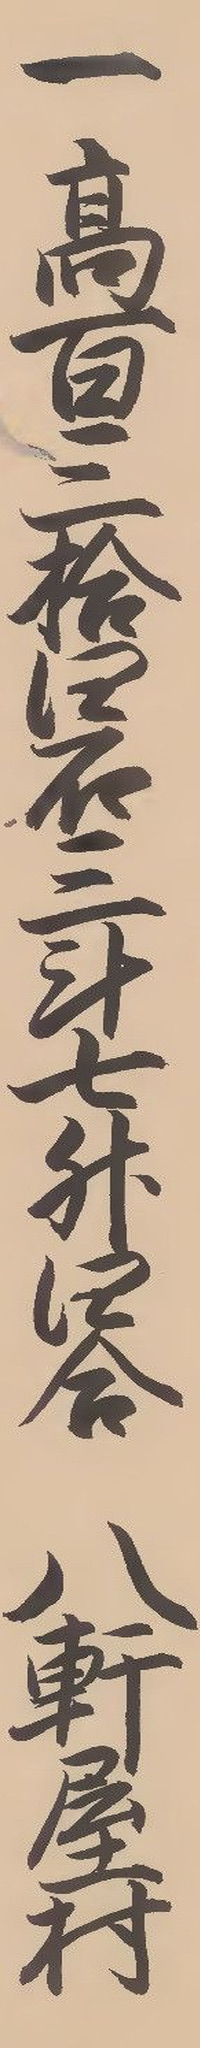一高百三拾四石三斗七升四合八軒屋村
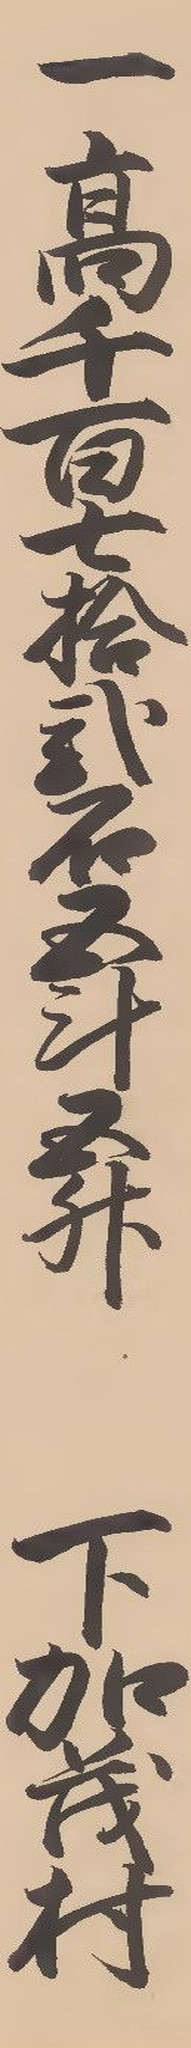一高千百七拾弐石五斗五升下加茂村
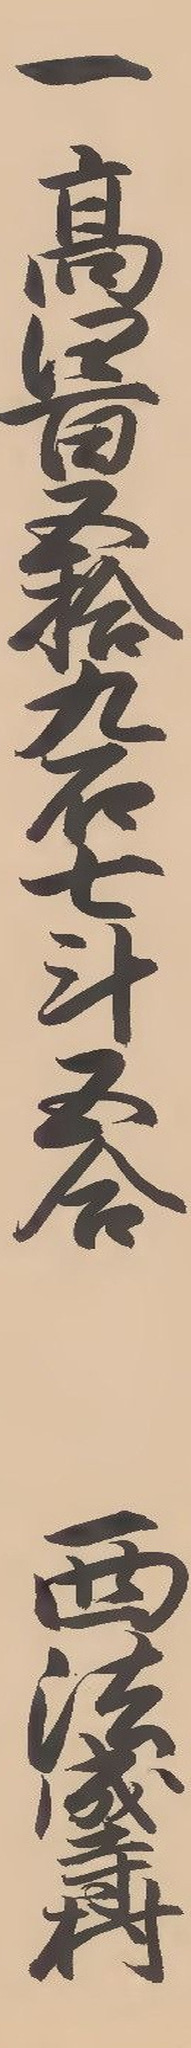一高四百五拾九石七斗五合西法成寺村
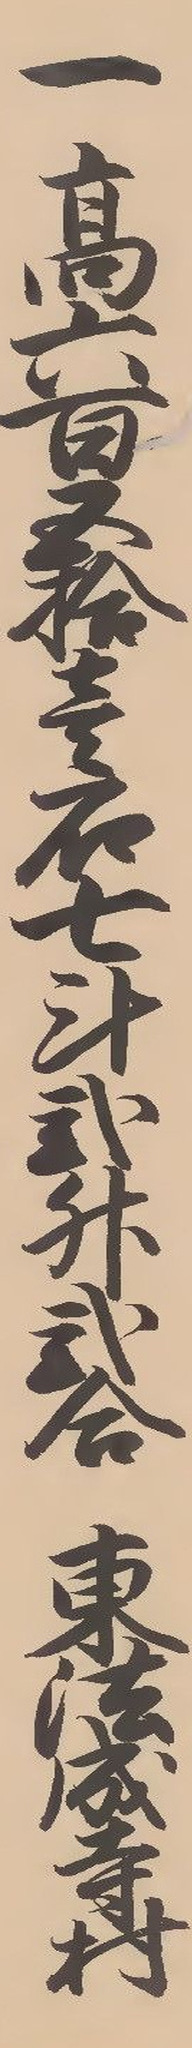一高六百五拾壱石七斗弐升弐合東法成寺村
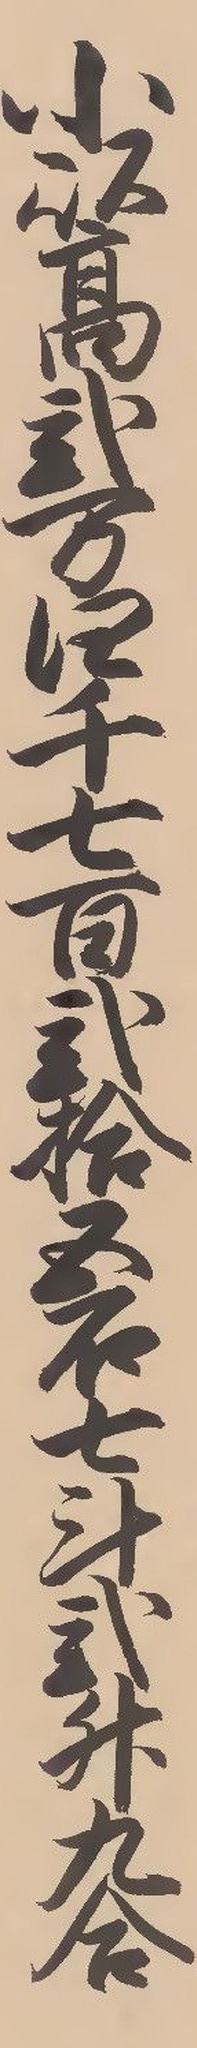小以高弐万四千七百弐拾五石七斗弐升九合

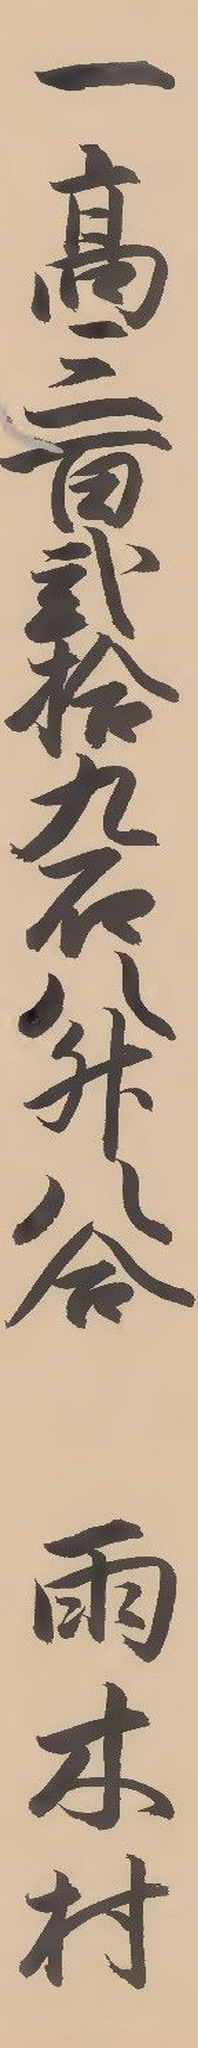一高三百弐拾九石八升八合雨木村
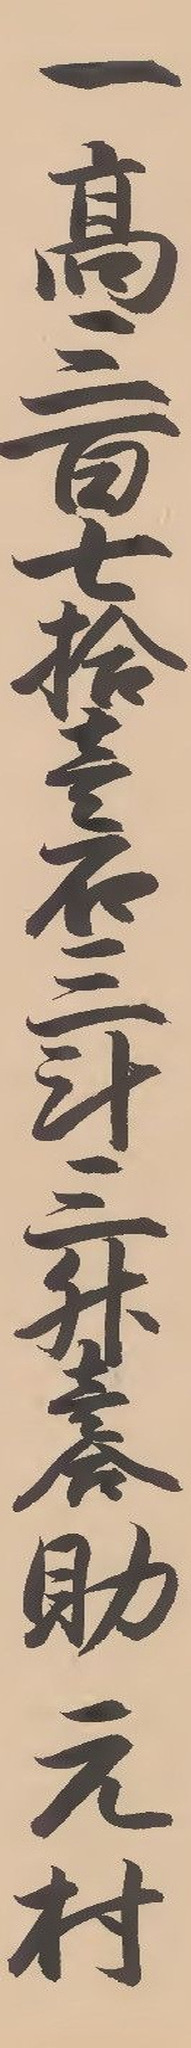一高三百七拾壱石三斗三升壱合助元村
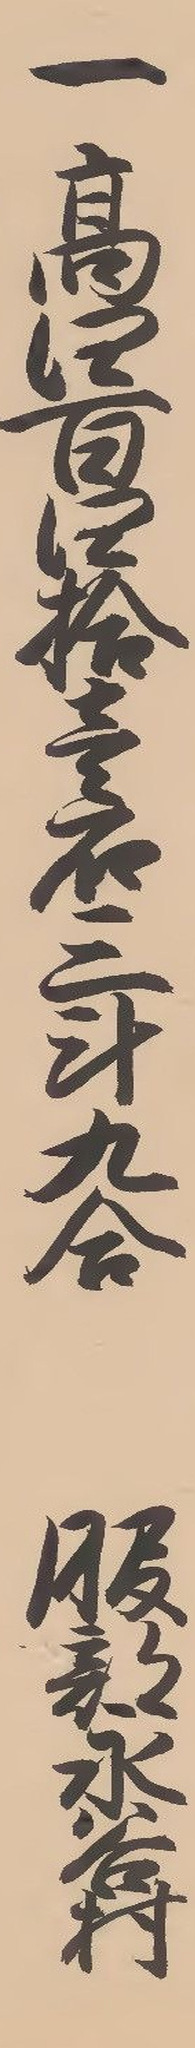一高四百四拾壱石三斗九合服部永谷村
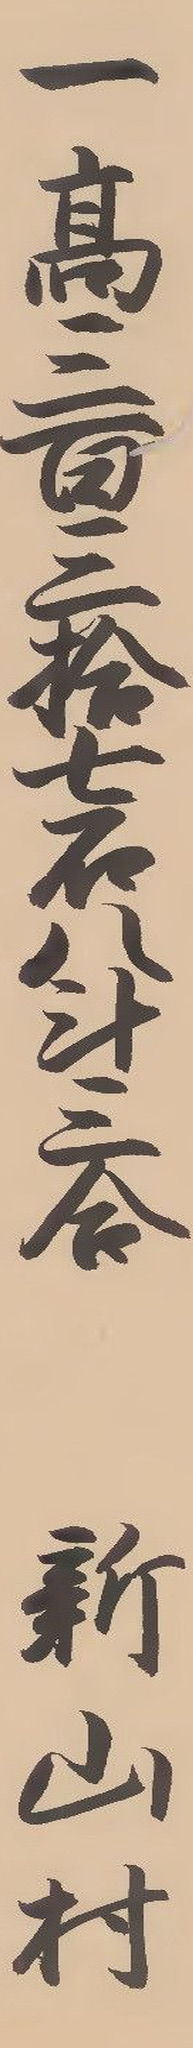一高三百三拾七石八斗三合新山村
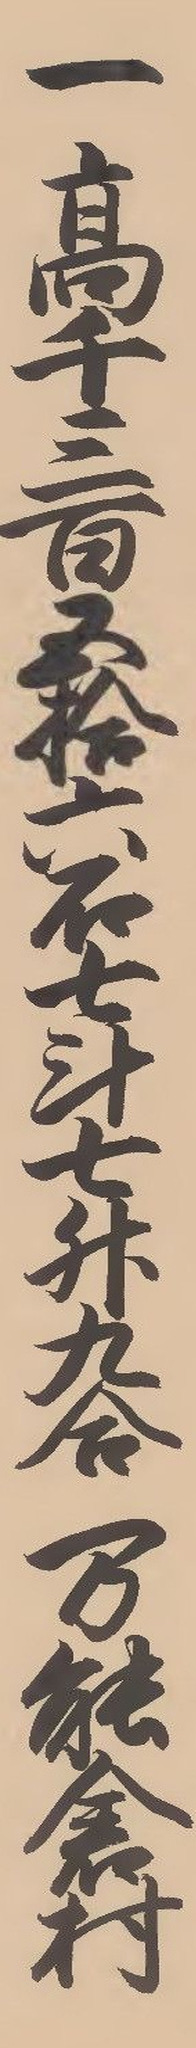一高千三百五拾六石七斗七升九合万能倉村
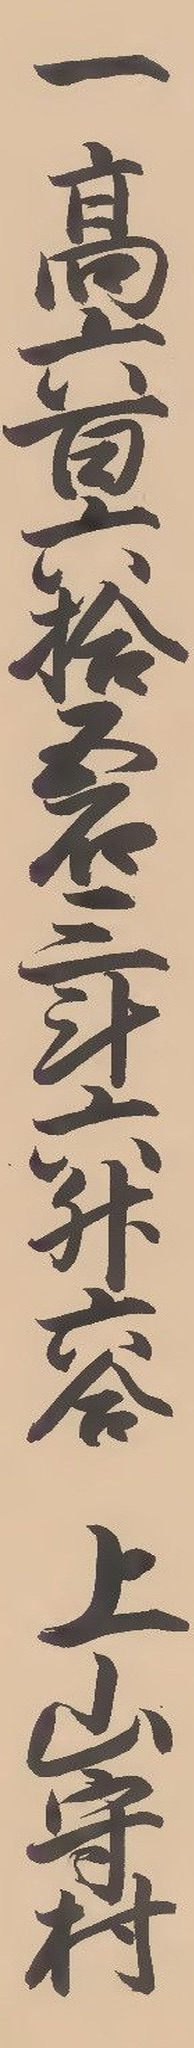一高六百六拾五石三斗六升六合上山守村

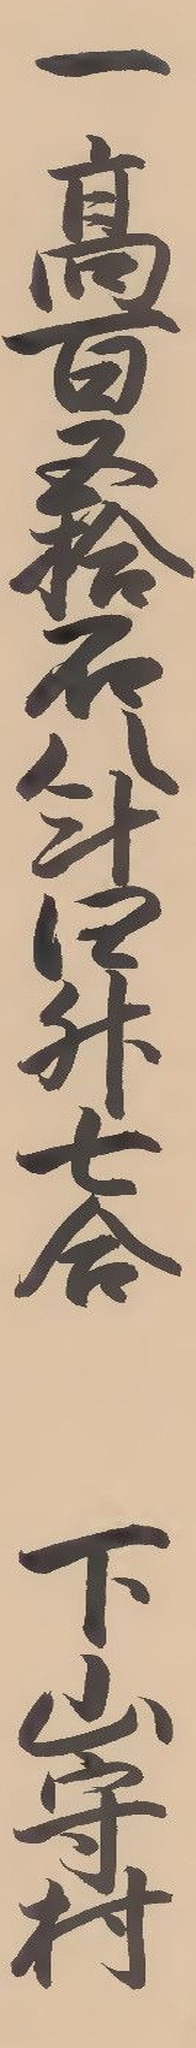一高百五拾石八斗四升七合下山守村
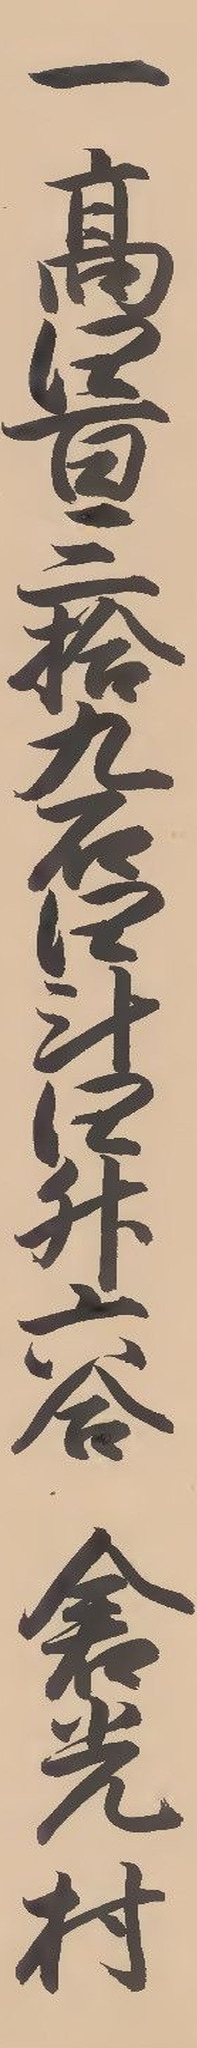一高四百三拾九石四斗四升六合倉光村
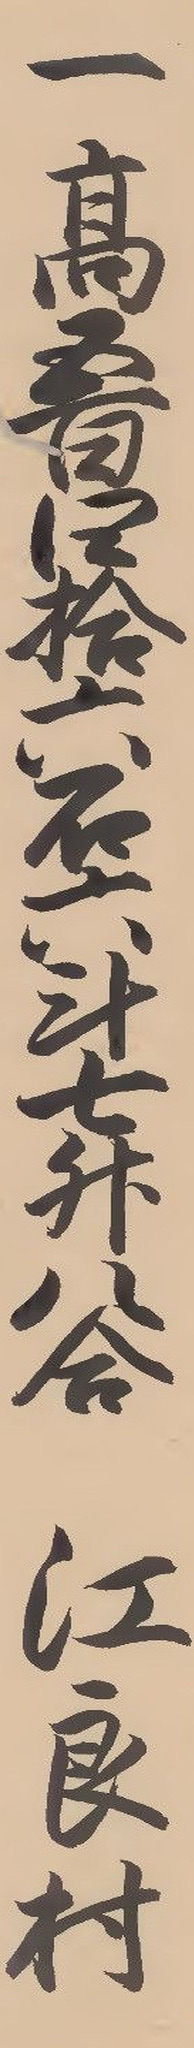一高五百四拾六石六斗七升八合江良村
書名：備後国郷帳
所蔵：国立公文書館 National Archives of Japan
